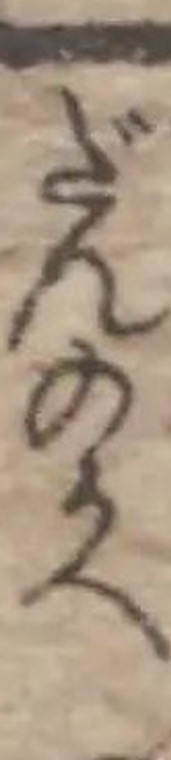だんのうへ
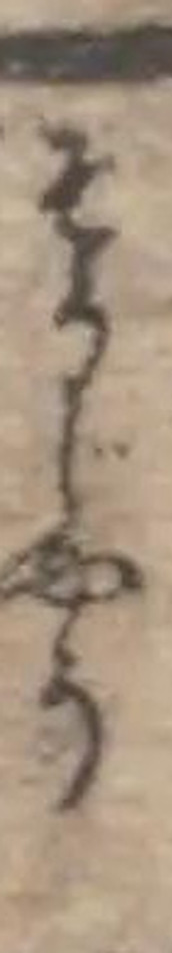そうじやう
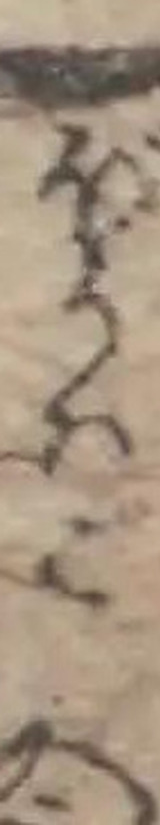ぼうハご
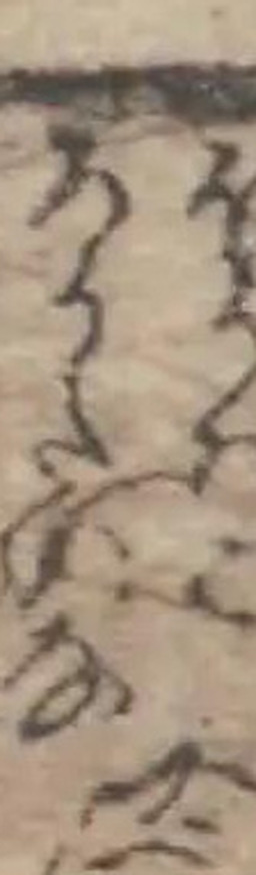ろうたいな
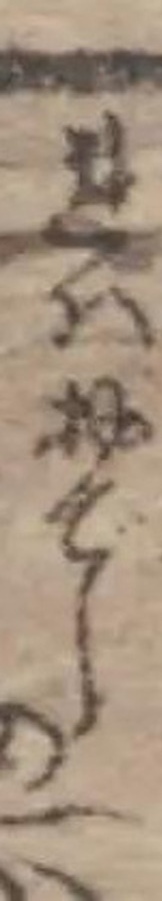れハおでしの
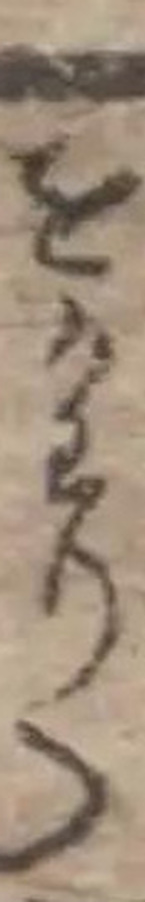をかわり
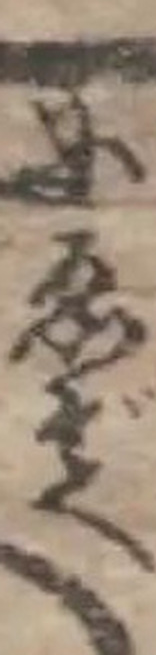にゑぞへ

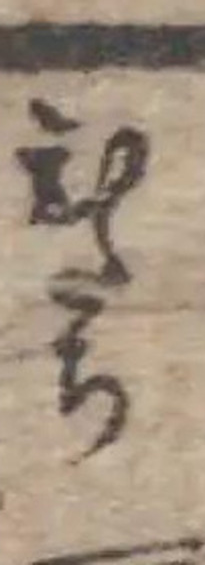ひたち
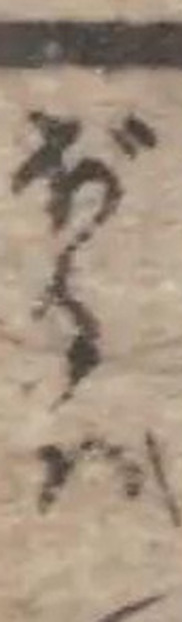ぼうハ
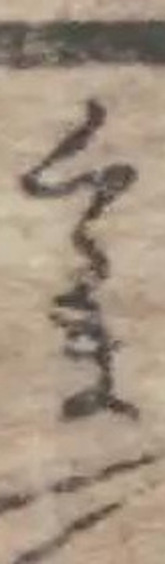くらま
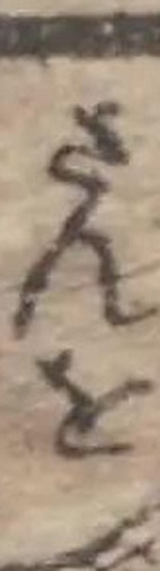さんを
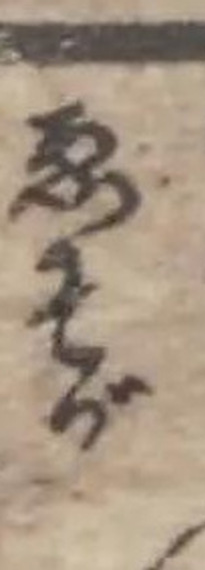ゑそが
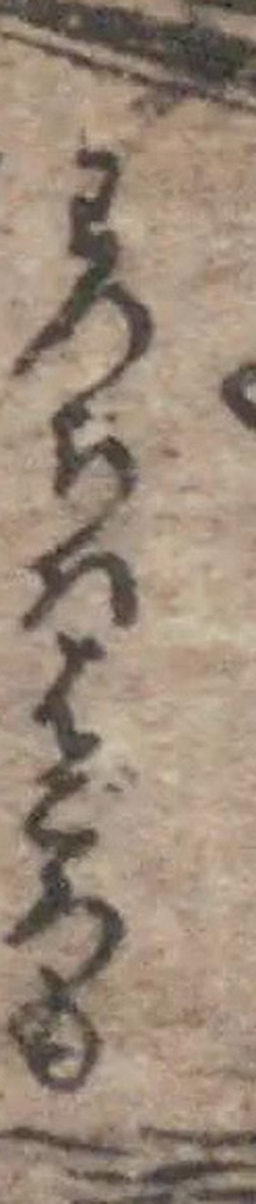わつちハはごろも
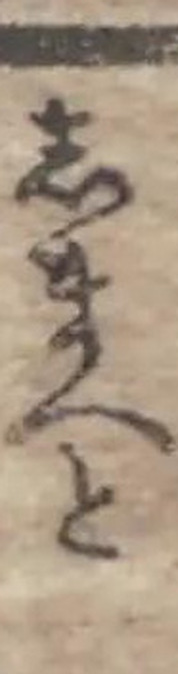しまへと
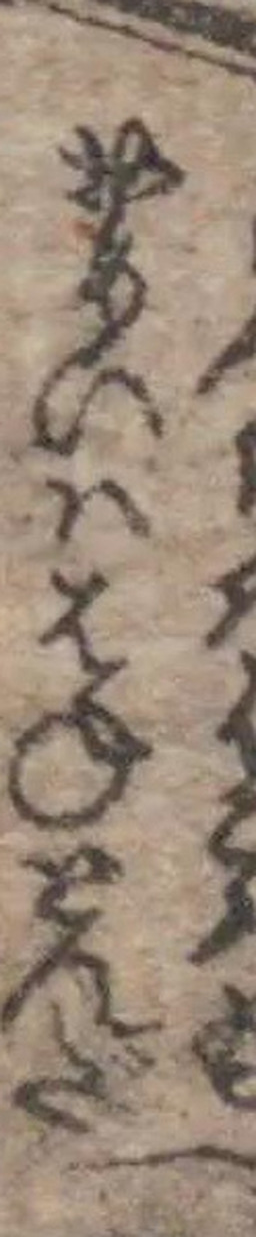おめいハはねとんだ
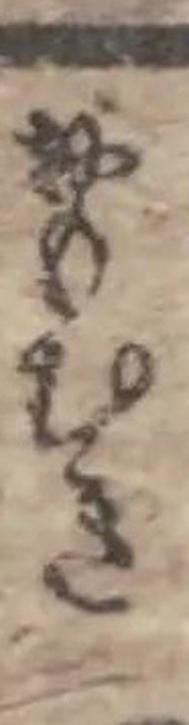おもむき
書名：草紙の曙 3巻
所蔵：国立国会図書館 National Diet Library, JAPAN
